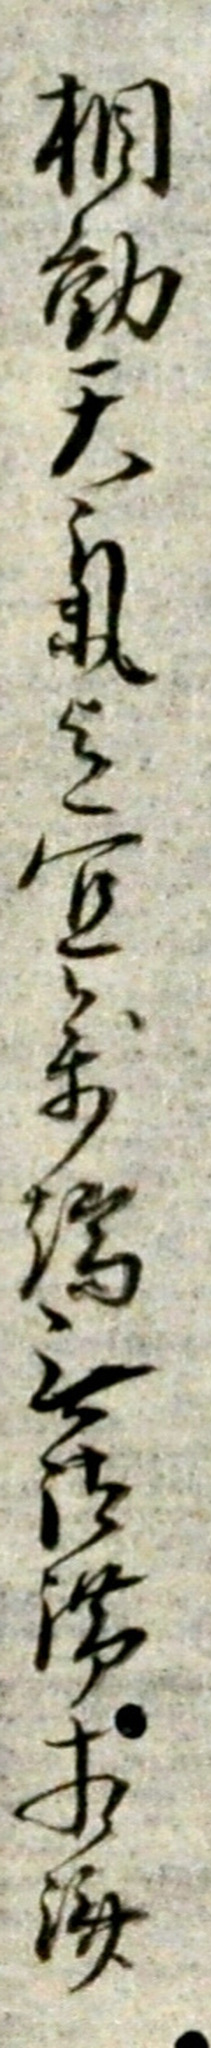相勤天気迄宜万端無御滞相済
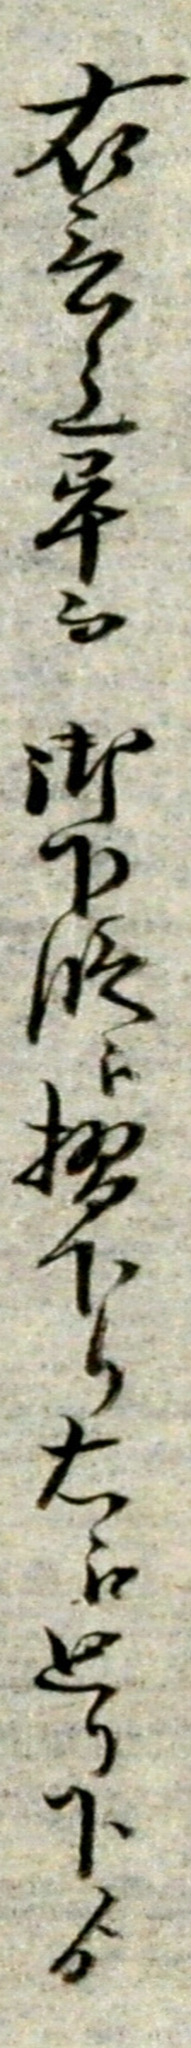右言上畢而御下段江摺下り右江廻り下ゟ

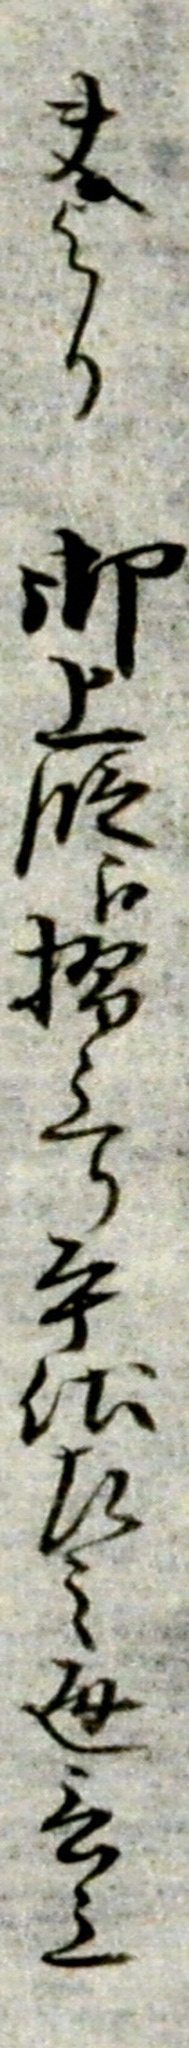夫より御上段江摺上り平伏左之通言上
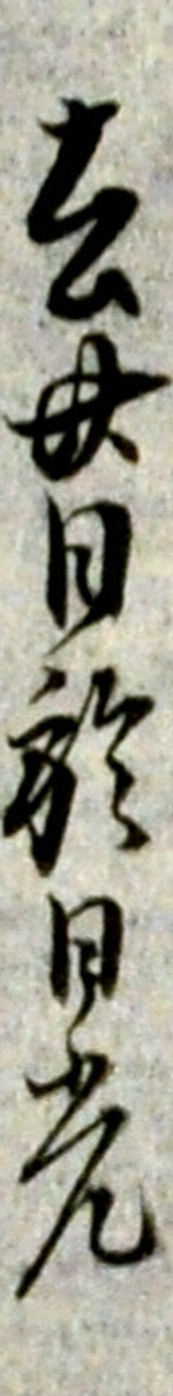去廿日於日光
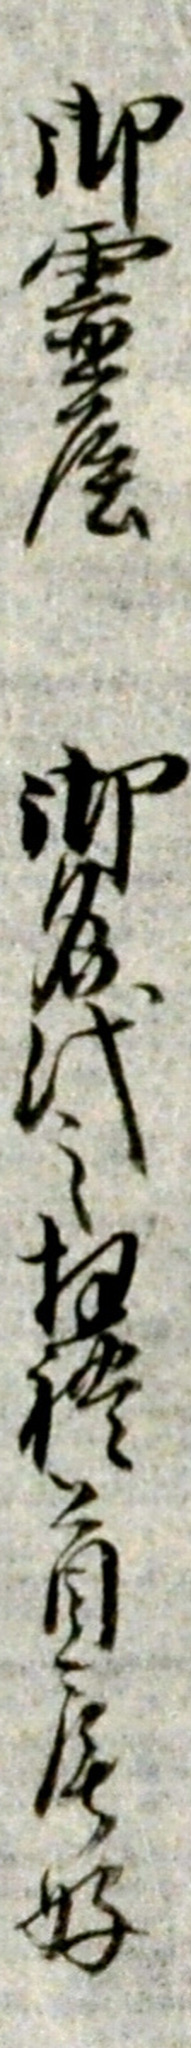御霊屋御名代之拝禮首尾好
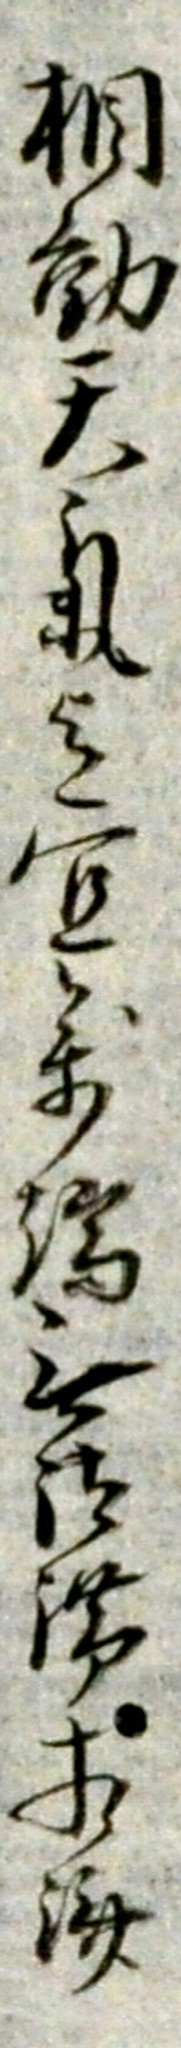相勤天気迠宜万端無御滞相済
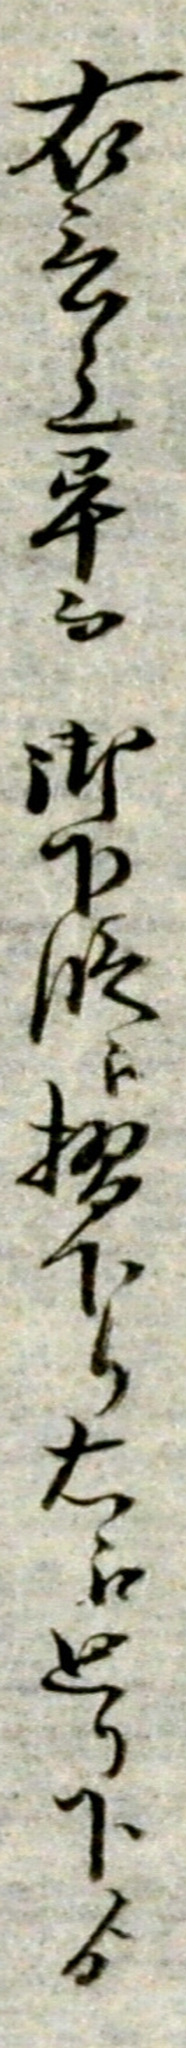右言上畢而御下段江摺下り右江廻り下ゟ
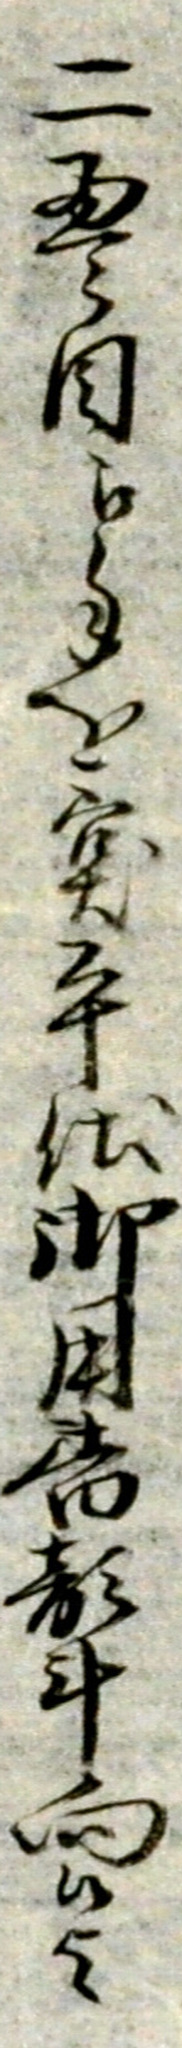二畳目江手を突平伏御用番顔計向候と
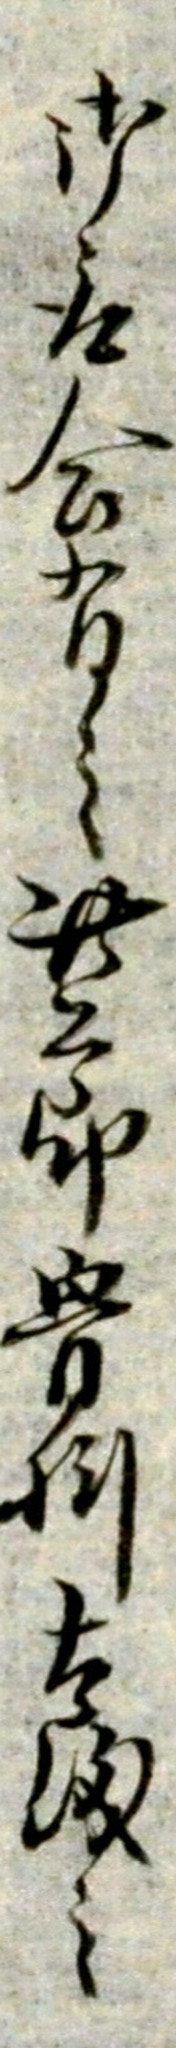御取合有之此節骨捌折太儀之
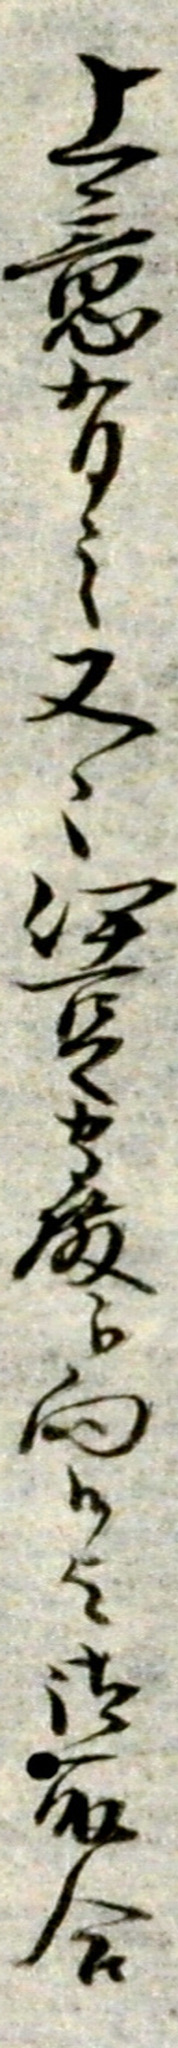上意有之又々伊豆守殿江向候と御取合
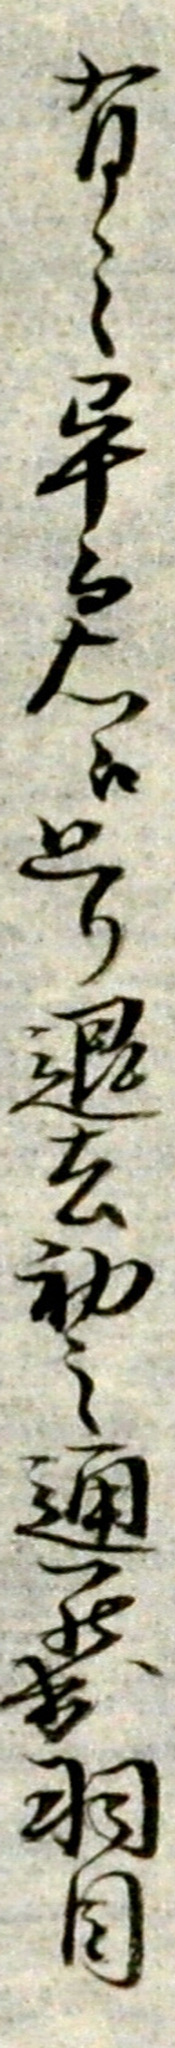有之畢而右江廻り退去初之通罷出羽目
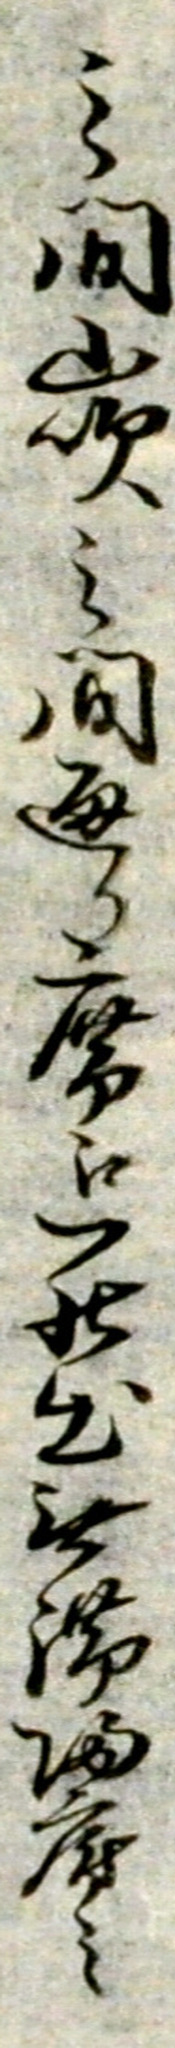之間山吹之間通り席江罷出無滞帰府之
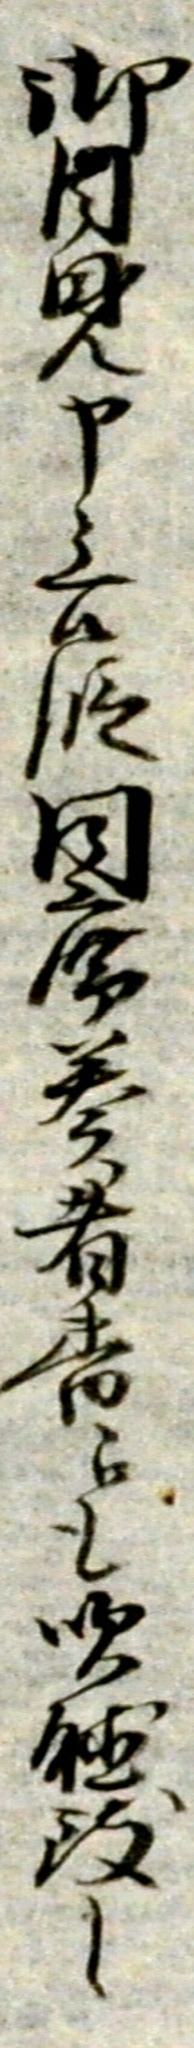御目見申上候段同席奏者番江も吹聴致し
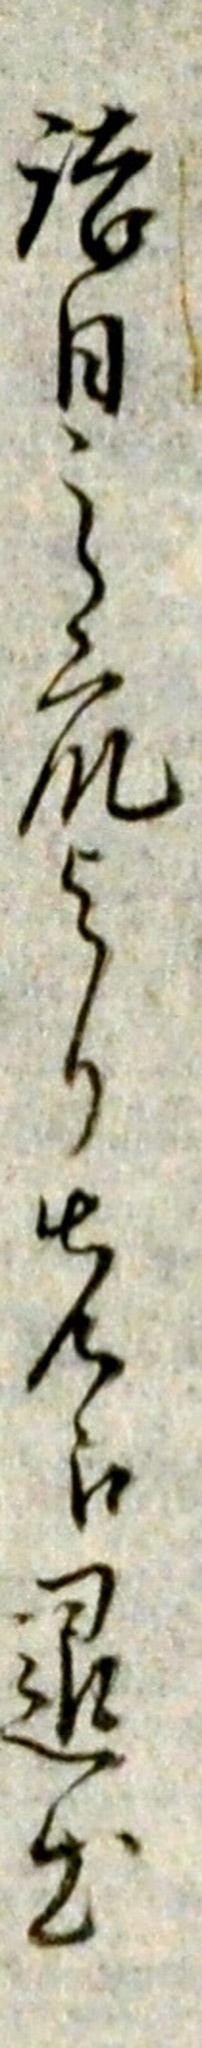詰日之衆より先江退出
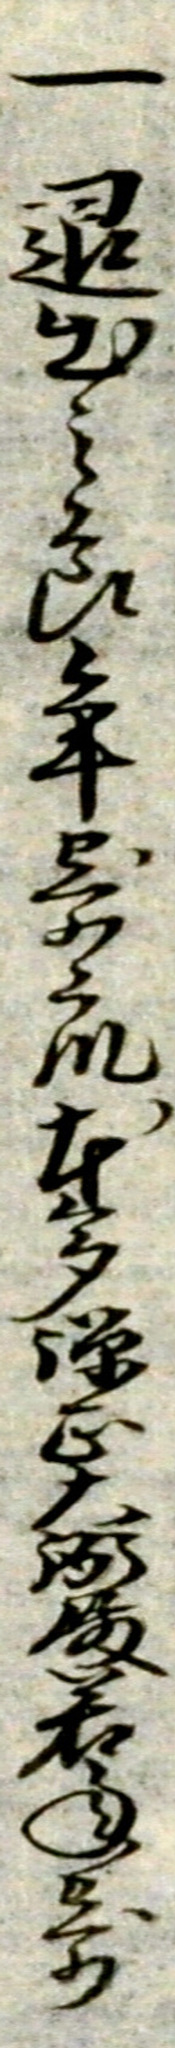一退出之節年寄衆本多弾正大弼殿若年寄
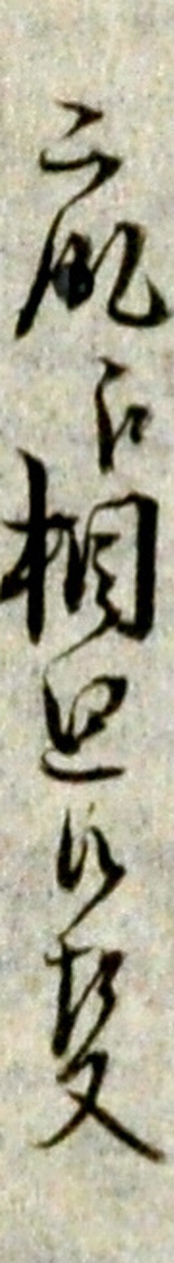衆江相廻候事
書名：日光御名代相勤候節ノ留
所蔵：伊那市立高遠町図書館・合同会社AMANE
